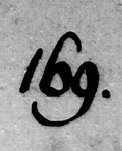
18.
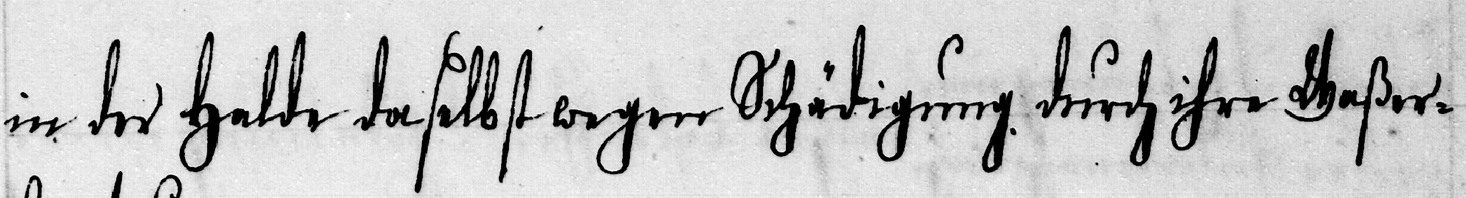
in der Halde daselbst wegen Schädigung durch ihre Waßer¬
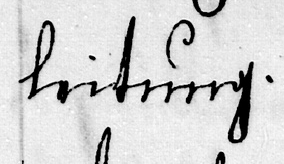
leitung.
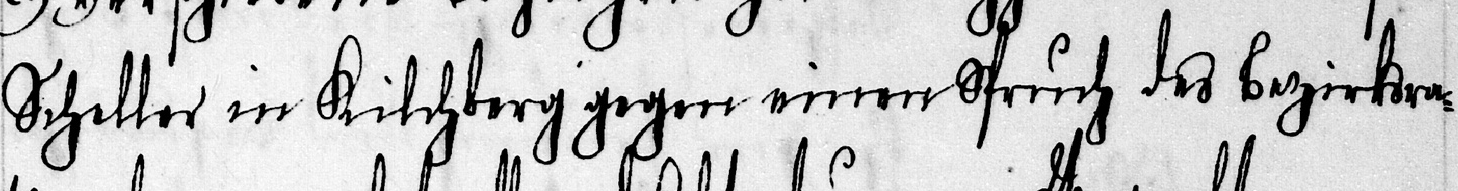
Scheller in Kilchberg gegen einen Spruch des Bezirksra¬
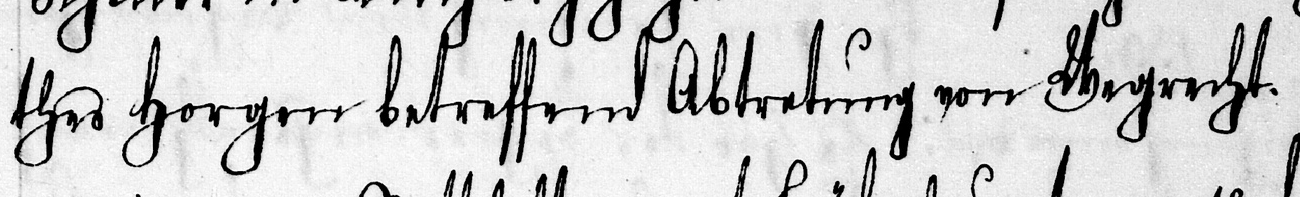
thes Horgen betreffend Abtretung von Wegrecht.
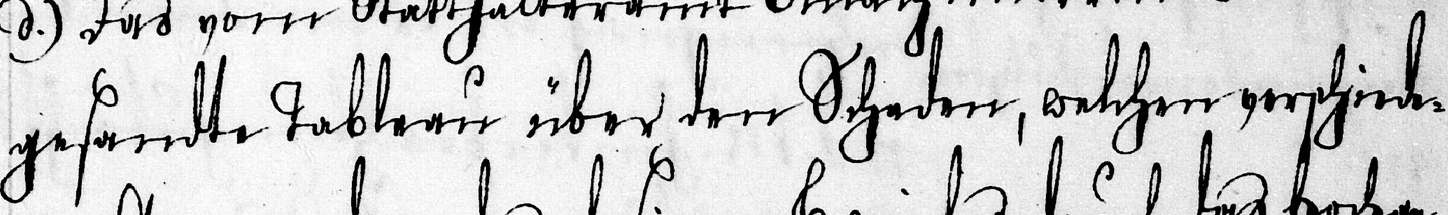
gesandte Tableau über den Schaden, welchen verschiede¬
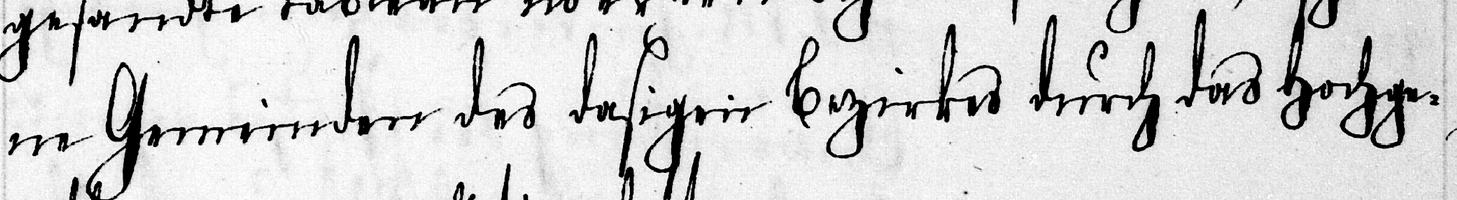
ne Gemeinden des dasigen Bezirkes durch das Hochge¬
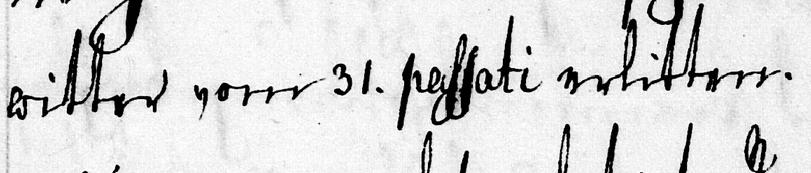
witter vom 31. passati erlitten.
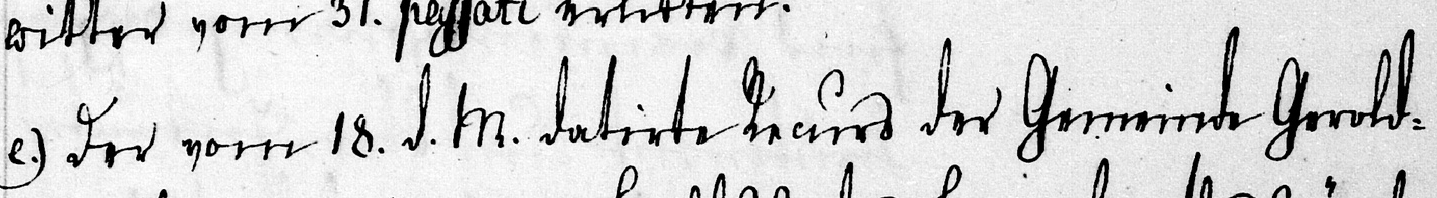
c.) Der vom 18. d. M. datirte Recurs der Gemeinde Gerold¬
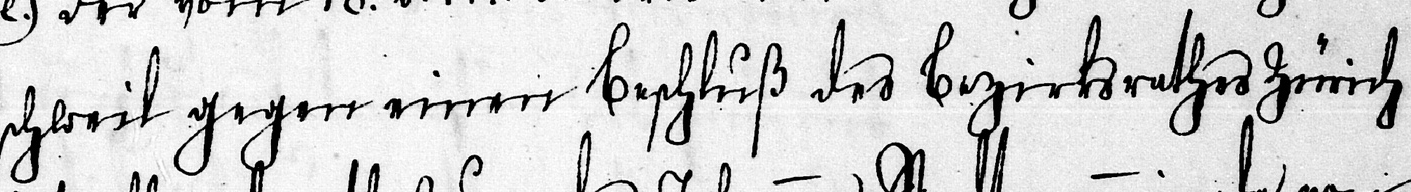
schweil gegen einen Beschluß des Bezirksrathes Zürich
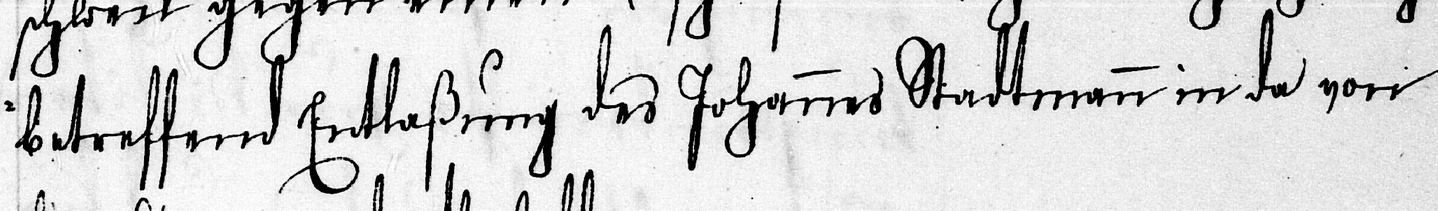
betreffend Entlaßung des Johannes Stadtmann in da von
